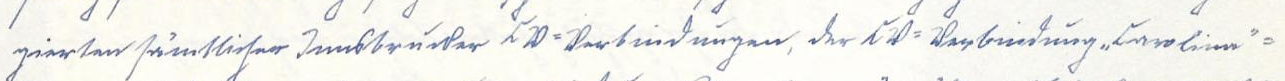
gierten sämtlicher Innsbrucker CV-Verbindungen, der CV-Verbindung „Carolina“-
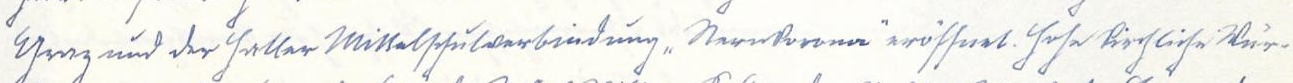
Graz und der Haller Mittelschulverbindung „Sternkorona“ eröffnet. Hohe kirchliche Wür-
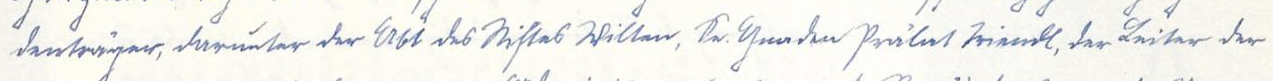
denträger, darunter der Abt des Stiftes Wilten, Se. Gnaden Prälat Triendl, der Leiter der
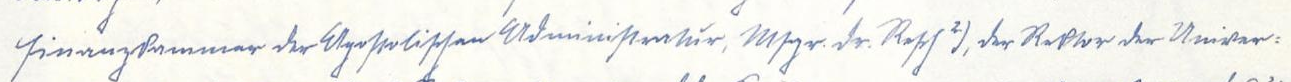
Finanzkammer der apostolischen Administratur, Msgr. dr. Resch 2), der Rektor der Univer-
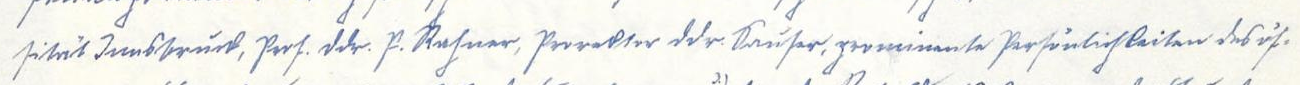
sität Innsbruck, Prof. DDr. P. Rahner, Prorektor DDr. Sauser, prominente Persönlichkeiten des öf-
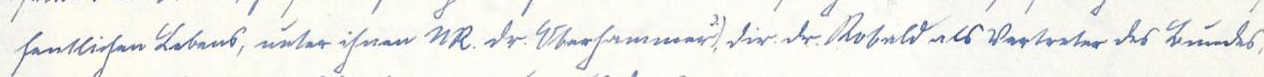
fentlichen Lebens, unter ihnen NR Dr. Oberhammer, 3) Dir. Dr. Robeld als Vertreter des Bundes,
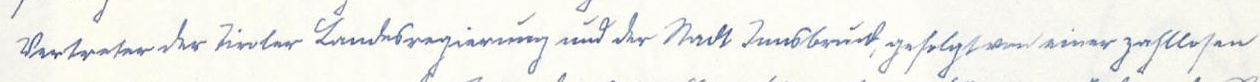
Vertreter der Tiroler Landesregierung und der Stadt Innsbruck, gefolgt von einer zahllosen
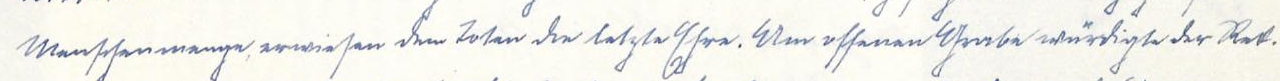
Menschenmenge erwiesen dem Toten die letzte Ehre. Am offenen Grabe würdigte der Rek-
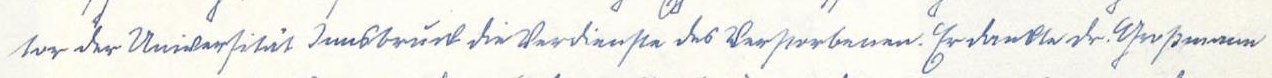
tor der Universität Innsbruck die Verdienste des Verstorbenen. Er dankte Dr. Großmann
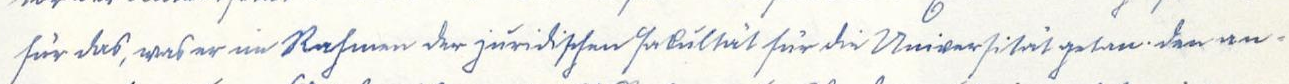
für das, was er im Rahmen der juridischen Fakultät der Universität getan. Den an-
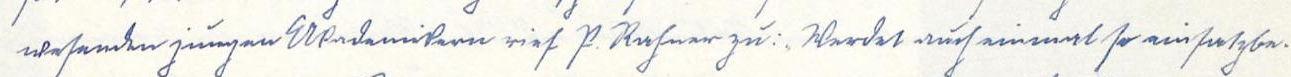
wesenden jungen Akademikern rief Rahner zu: „Werdet auch einmal so einsatzbe-
